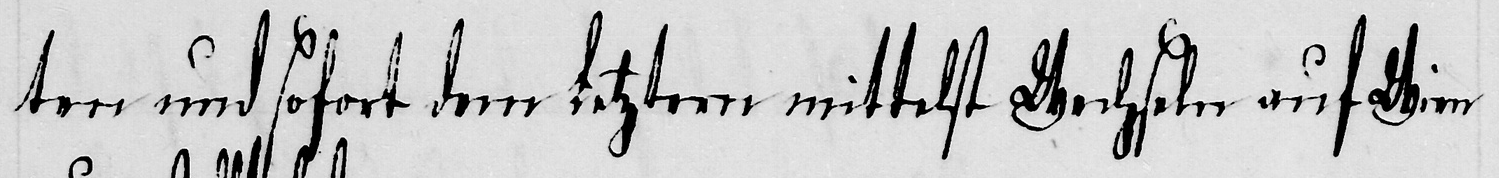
ten und sofort dem Letztern mittelst Wechseln auf Wien
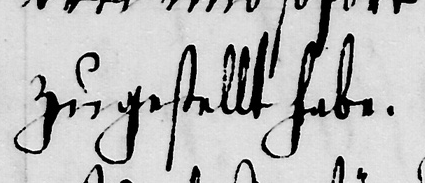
zugestellt hab¬
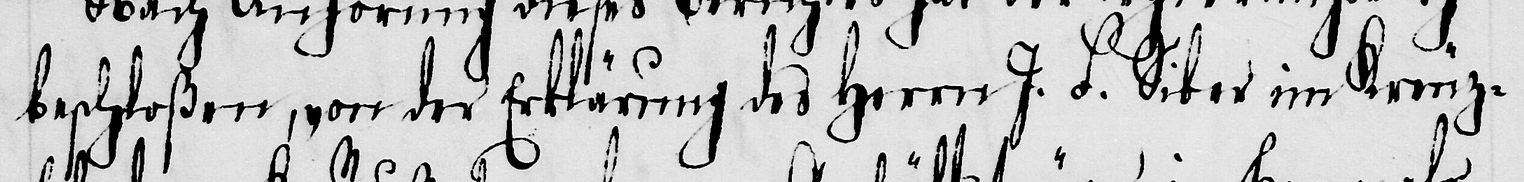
beschloßen, von der Erklärung des Herrn J. F. Siber im Kreuz¬
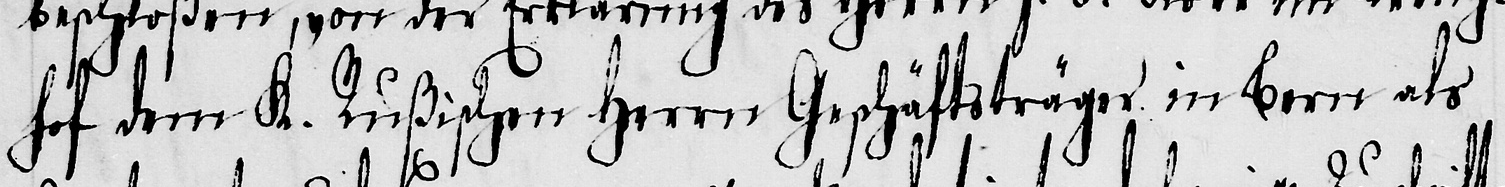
hof dem K. Rußischen Herrn Geschäftsträger in Bern als
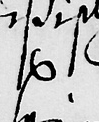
e.
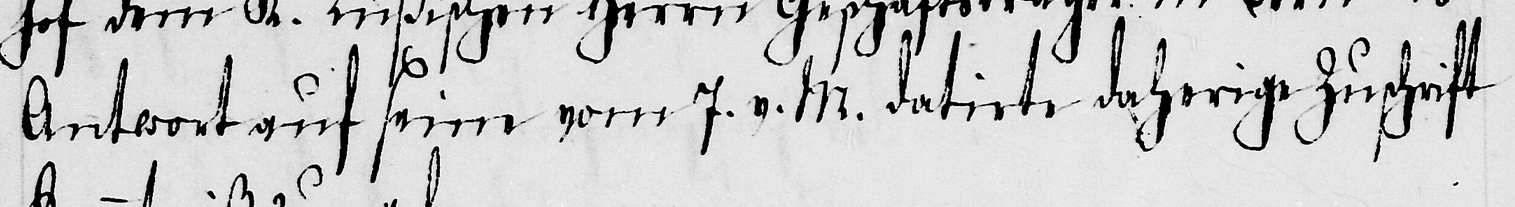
Antwort auf seine vom 7. v. M. datirte daherige Zuschrift
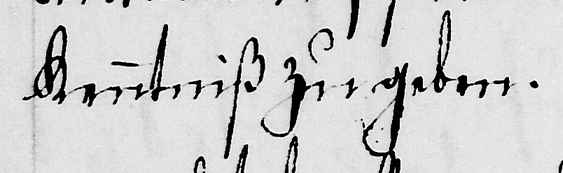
Kenntniß zu geben.
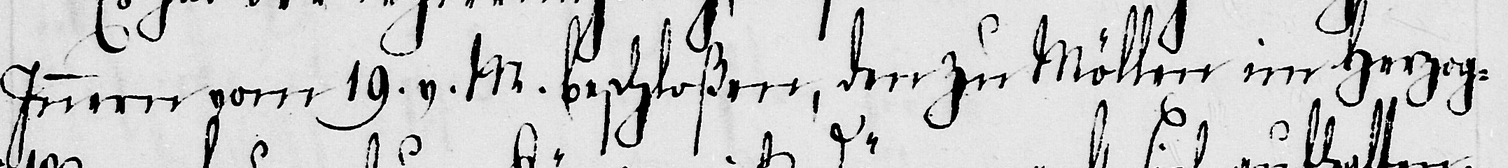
Innern vom 19. v. M. beschloßen, den zu Möllen im Herzog¬
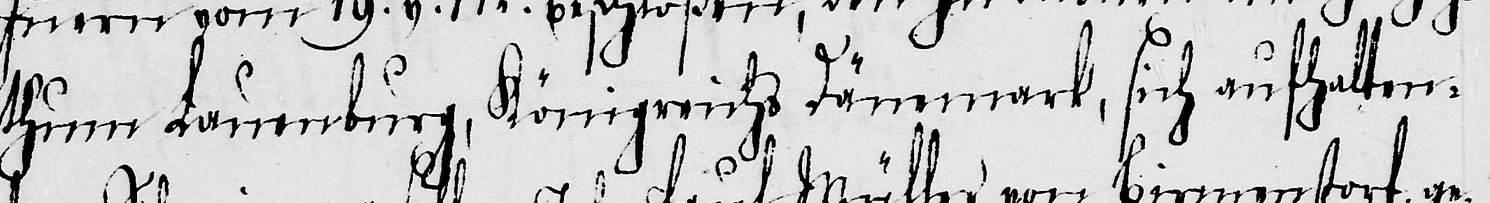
thum Lauenburg, Königreichs Dänemark, sich aufhalten¬
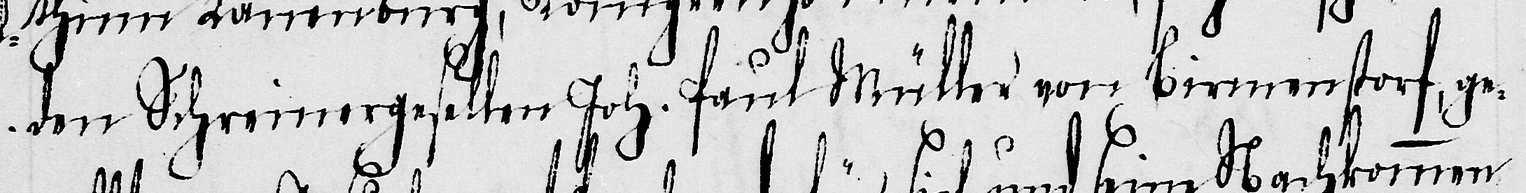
den Schreinergesellen [sic!] Joh. Paul Müller von Birmenstorf, ge¬
